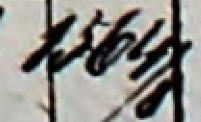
1564/?
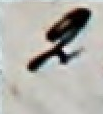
2
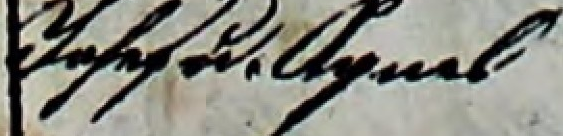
Josef u. Agnes
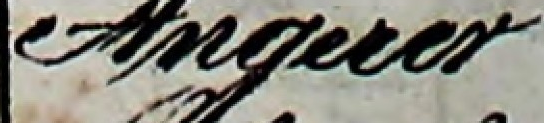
Angerer
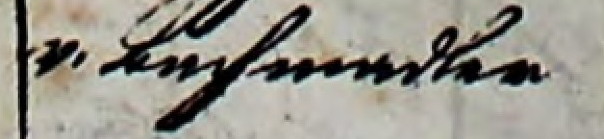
v. Bachmadler
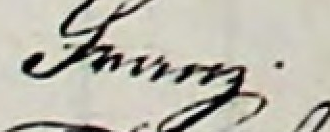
Franz
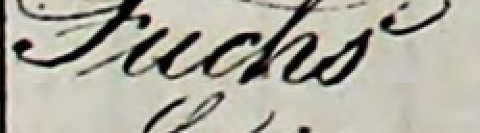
Fuchs
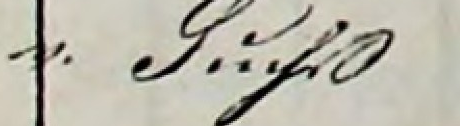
v. Fuchs
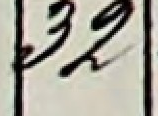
32
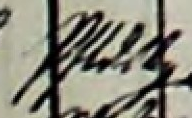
Pflindsbg
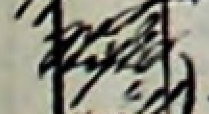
Stift„
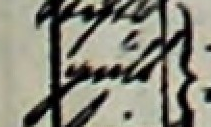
gütt
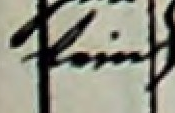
lein
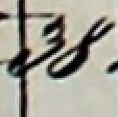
38
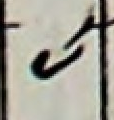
5
